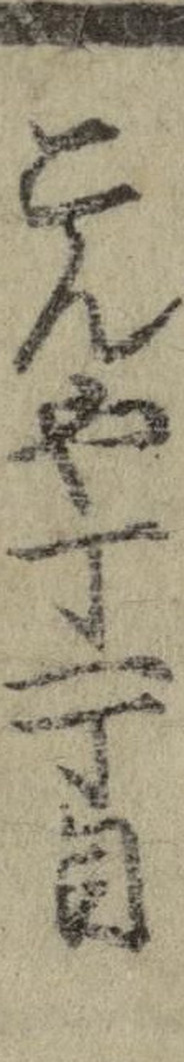こんや丁一丁目
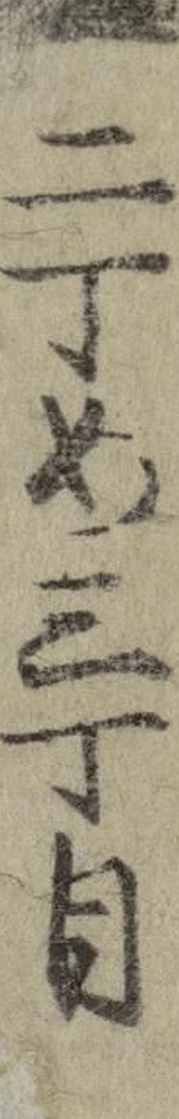二丁め三丁目
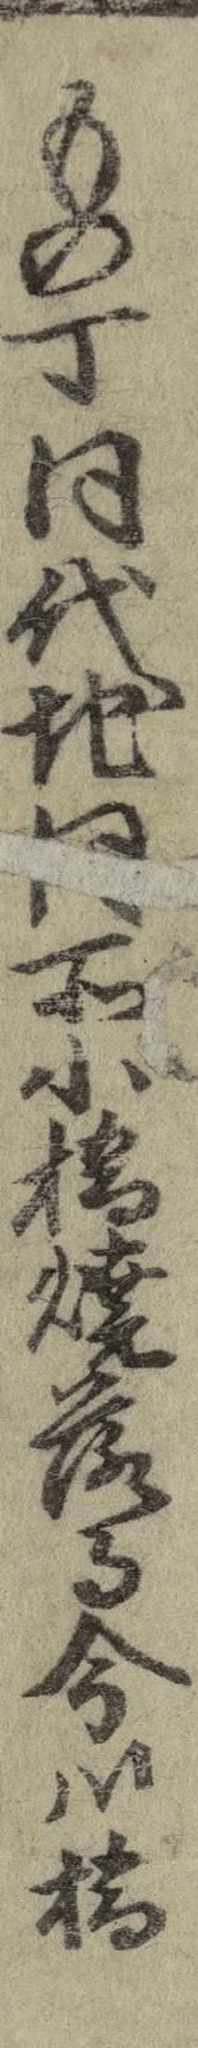もの丁同代地同所小橋焼落る今川橋
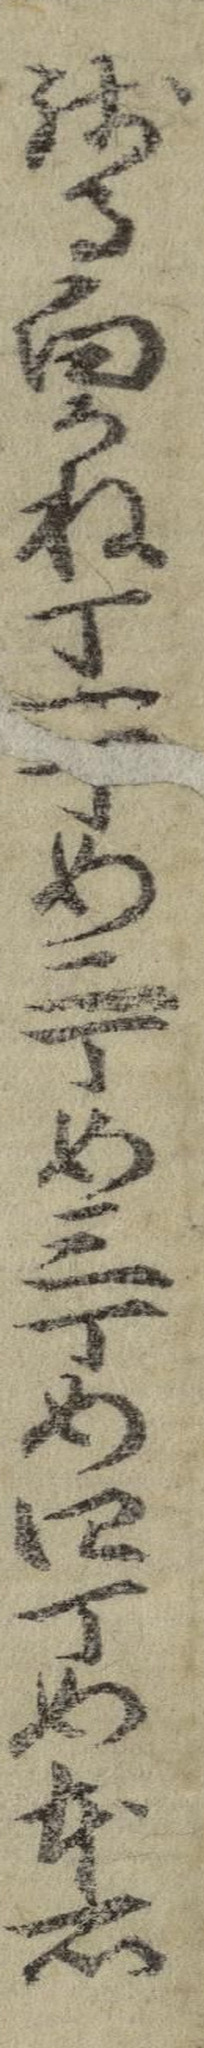残る白かね丁一丁め二丁め三丁め四丁め本石
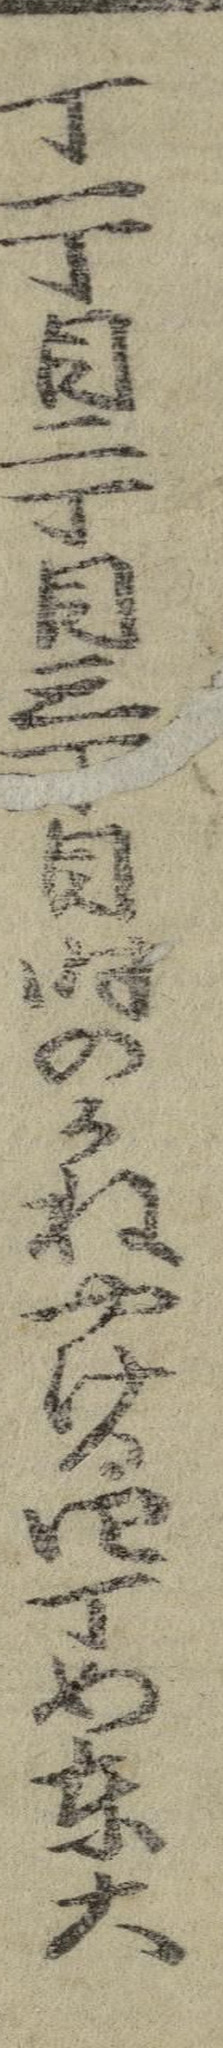丁一丁目二丁目三丁目時のかねやける四丁め東大
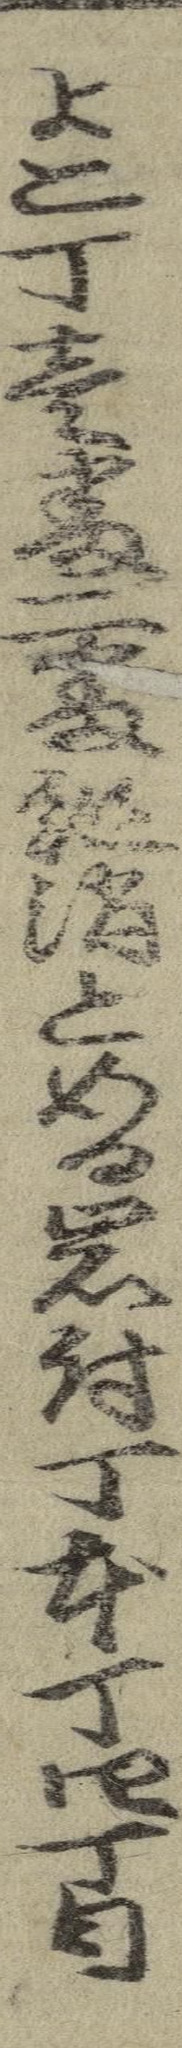よこ丁壱番二番組消とめる岩付丁本丁四丁目
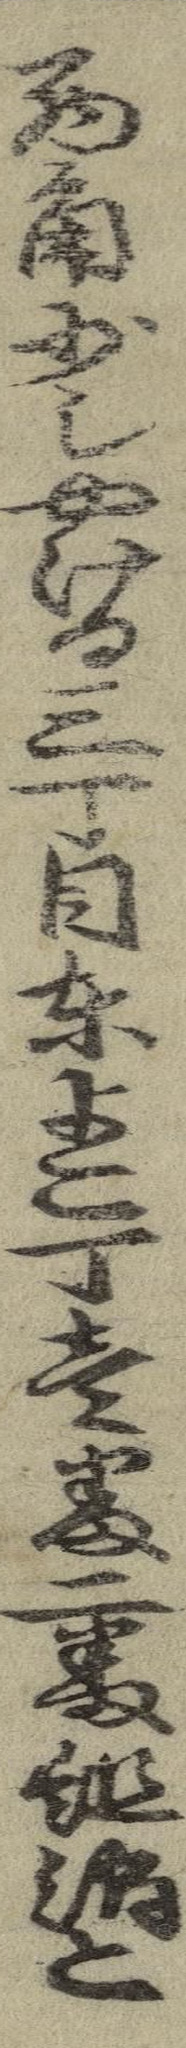西角少しやける三丁目東よこ丁壱番二番組消と
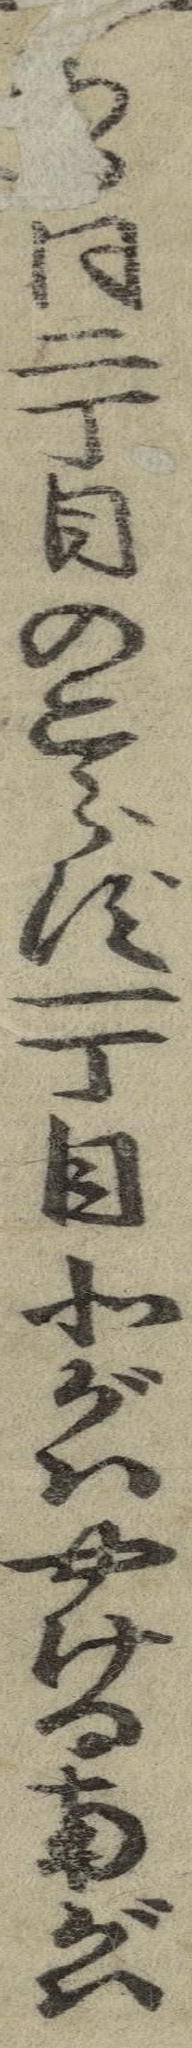める同弐丁目のこらず壱丁目北がはやける南がは
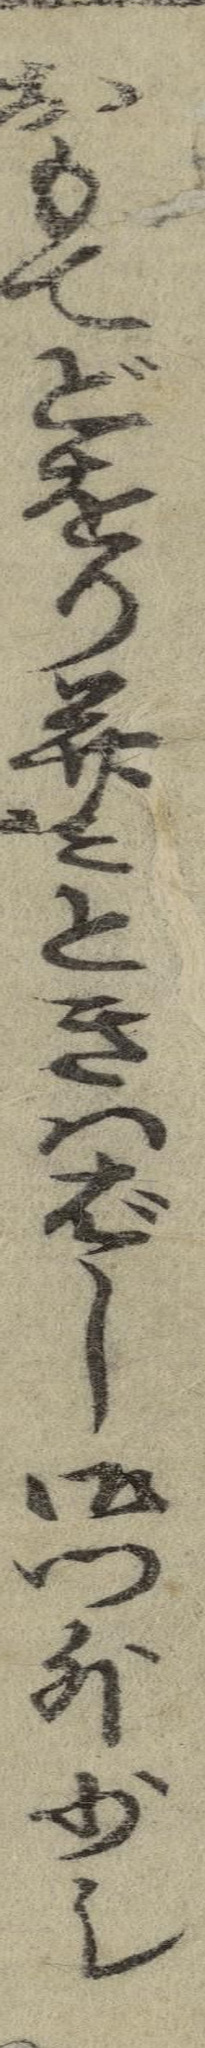おもてどをり幷ニときはばし御門外少し
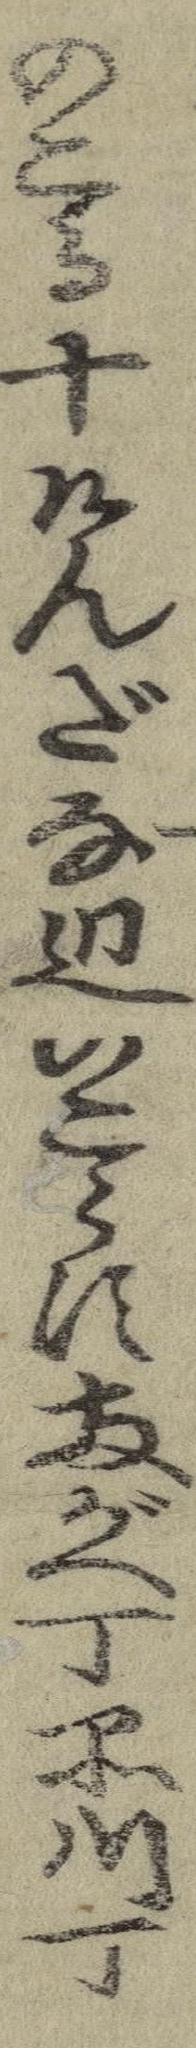のこる十けんだな辺のこらす両がへ丁品川丁
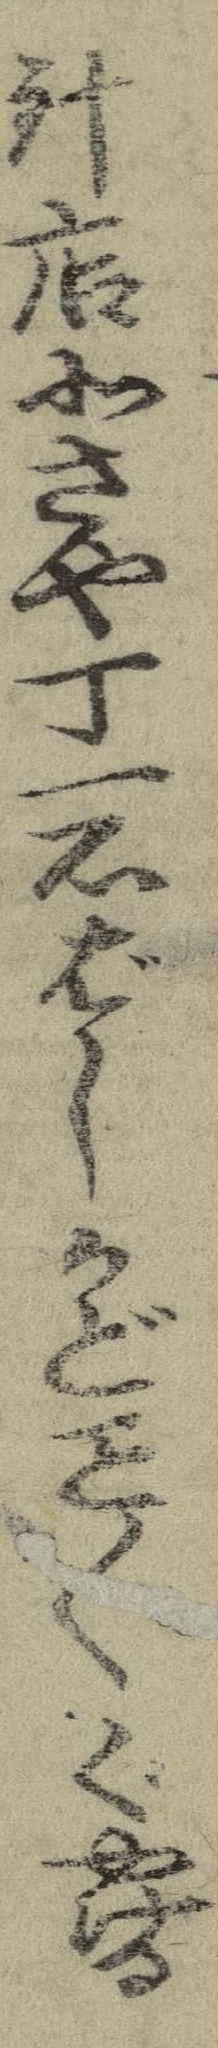針店北さや丁一石ばしかどこと〳〵くやける
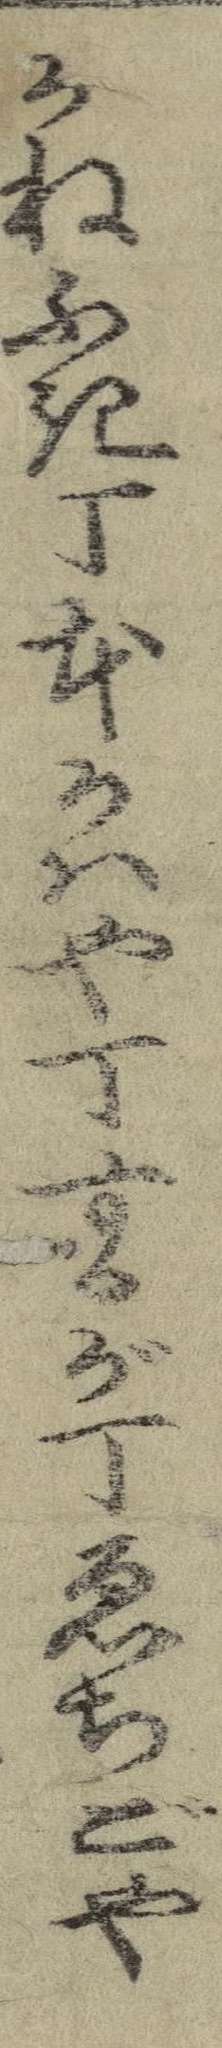かねふき丁本かはや丁するが丁ゑちごや
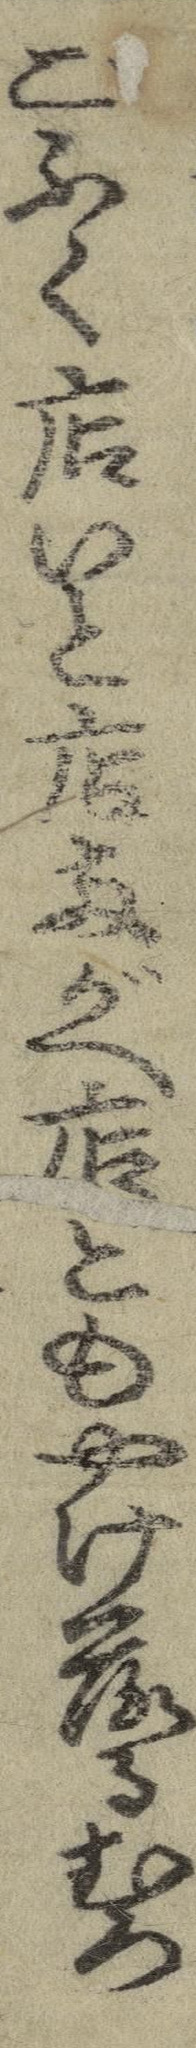こふく店いと店両がへ店ともやけ落るむろ
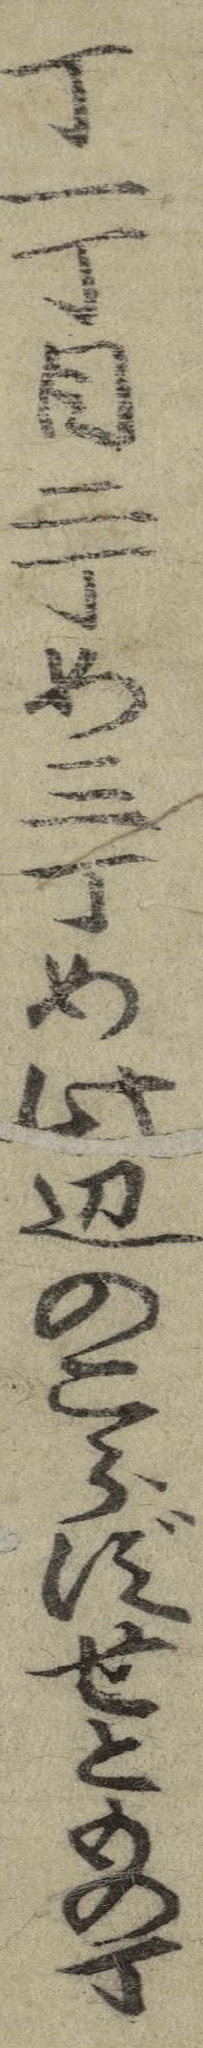丁壱丁目二丁め三丁め此辺のこらずせともの丁
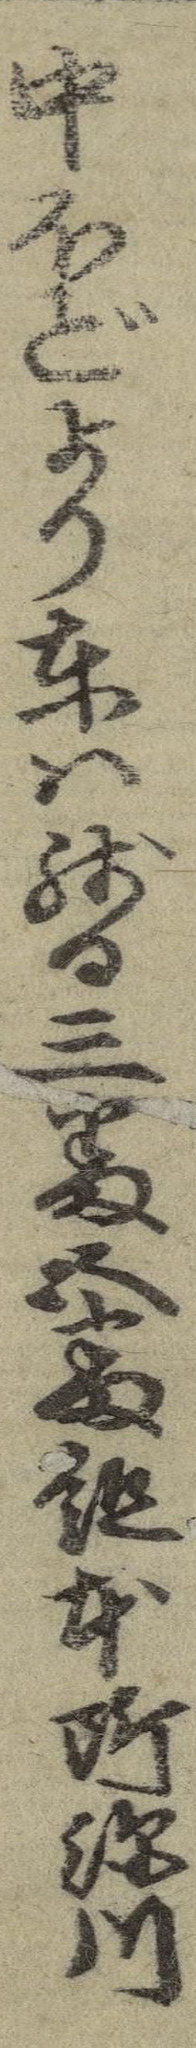仲ほどより東は残る三番五番組本所深川
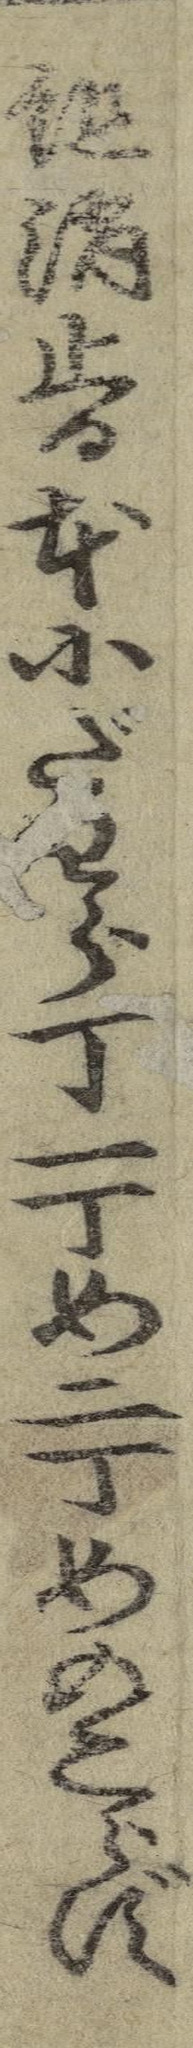組消止る本小たわら丁一丁め二丁めのこらず
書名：[安政元年十二月の江戸大火に関する瓦版]
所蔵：東京大学地震研究所図書室 Earthquake Research Institute Library, The University of Tokyo, JAPAN
